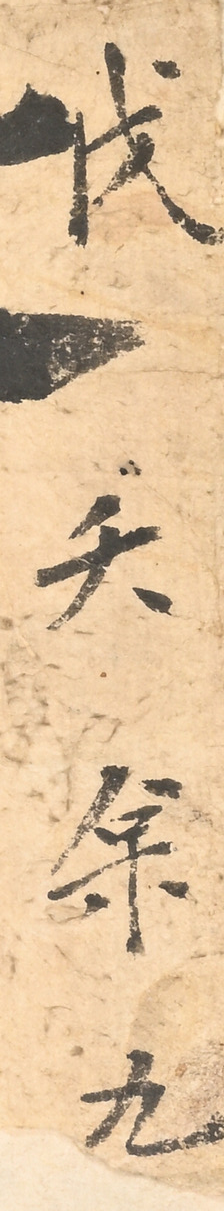戊天保九
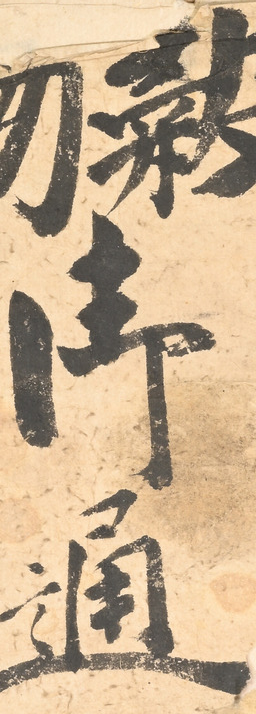物御通
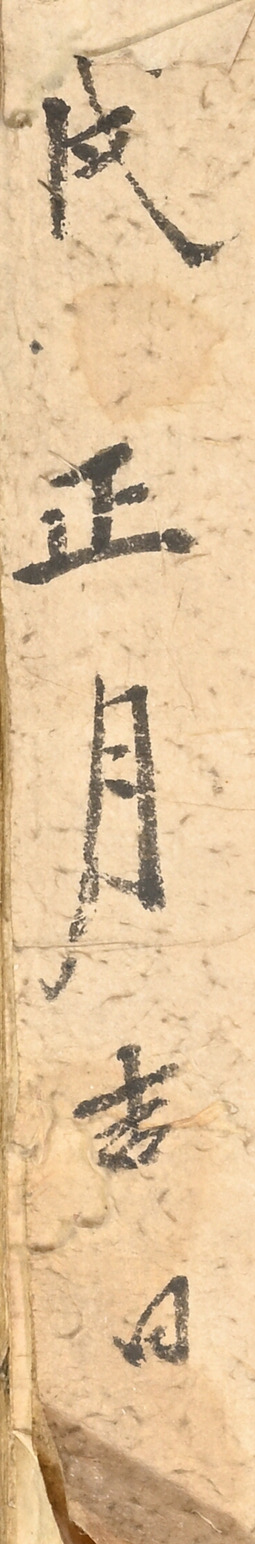戌正月吉日
